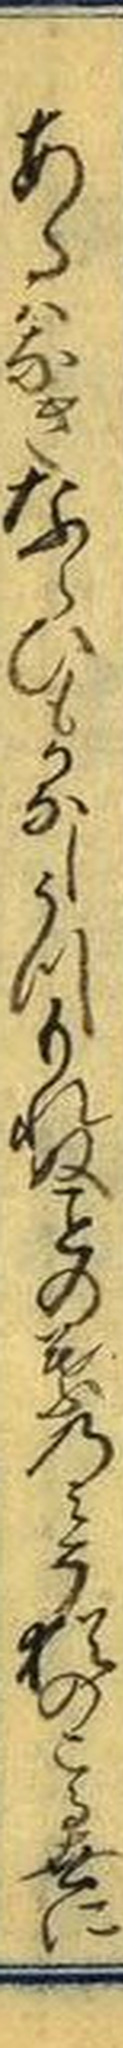あるはなきならひもかなしうつもれぬことのはのみそ猶のこる世に

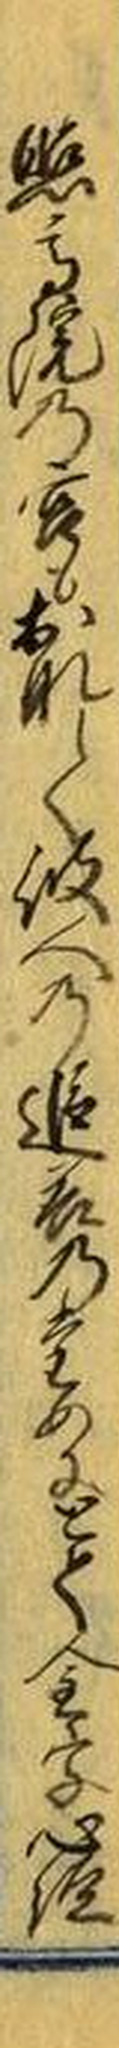照髙院の宮もおなしく彼人の追善のためにとて金字心経
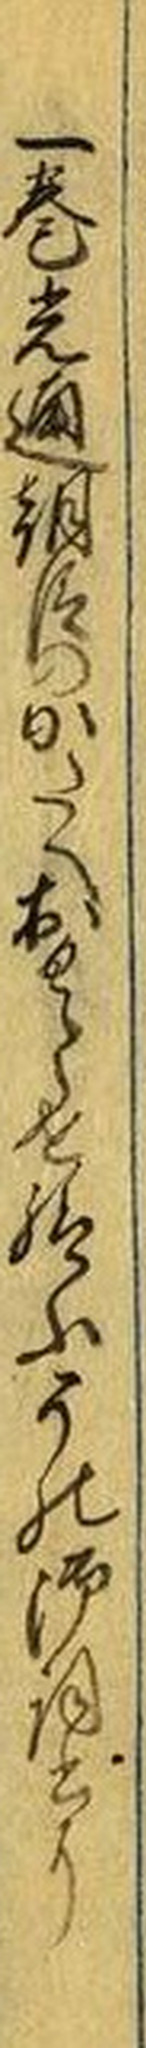一巻光通朝臣のかたへおくらせ給ふその御詞書に
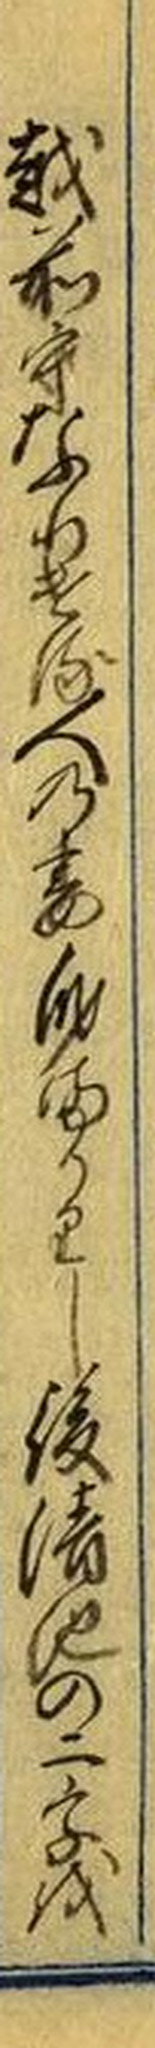越前守なりける人の妻みまかりし後清池の二字を
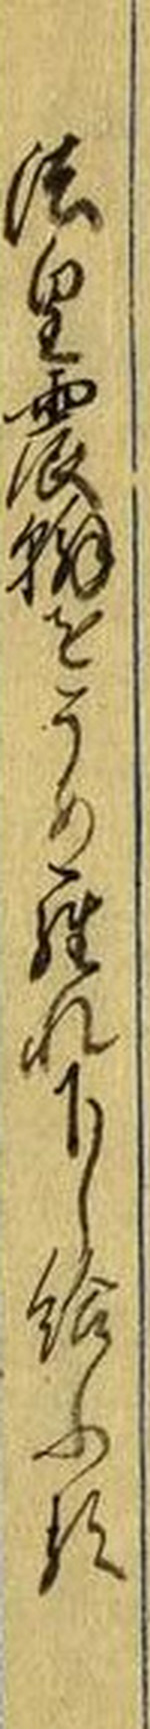法皇震翰をそめられ下し給ふる
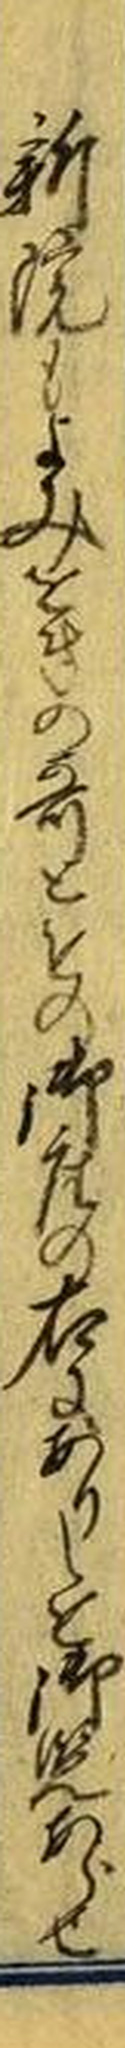新院もよみをきの哥ともの御座の右にありしと御覧あらせ
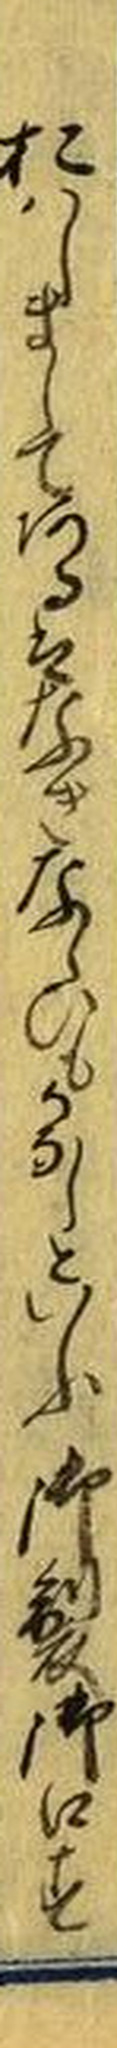おはしましてあるはなきならひもかなしといふ御製御口す
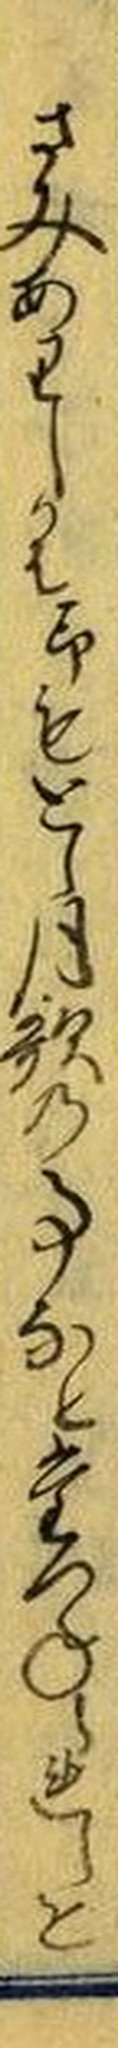さみありしかはひもとし月歌の事なとたつねられしを
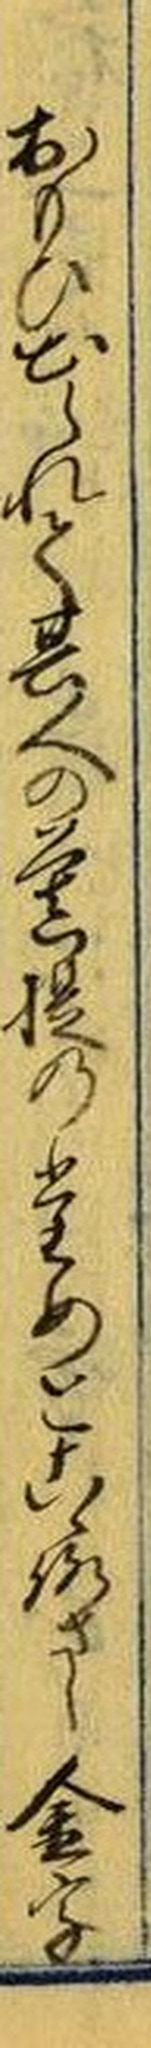おもひ出られて其人の菩提のためとこゝろさし金字
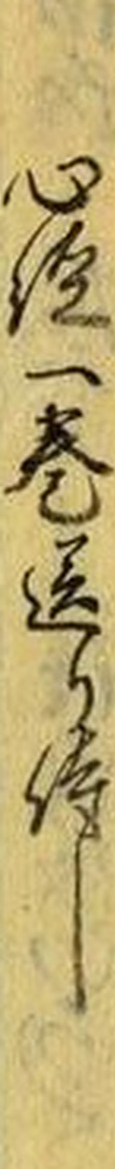心経一巻送り侍し
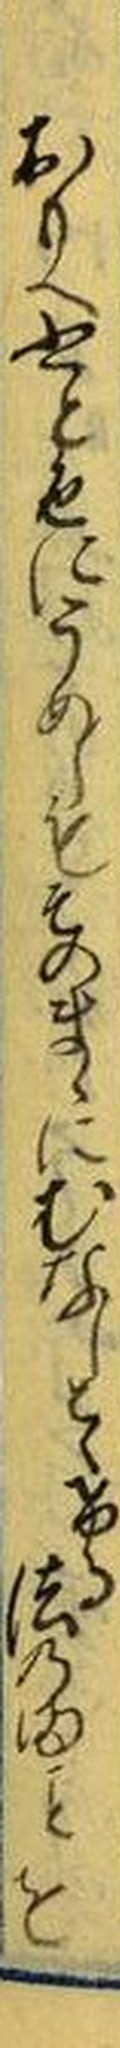おもへ出と色にそめしもそのまゝにむなしとゝける法のまことを
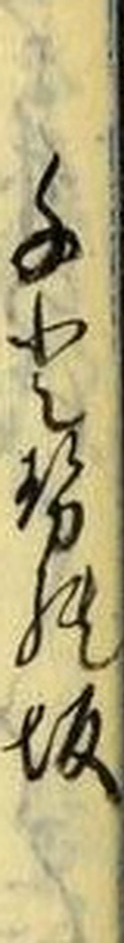千とせの坂
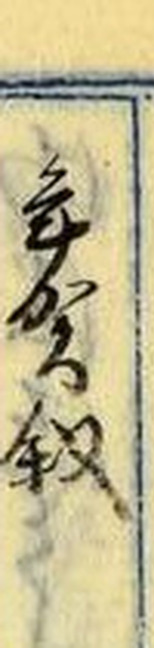年賀叙
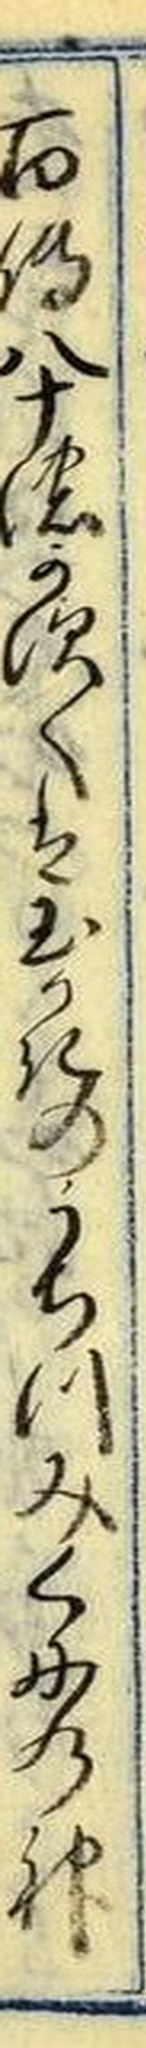百伝八十のかす〳〵は玉かきのうちつみくにの神
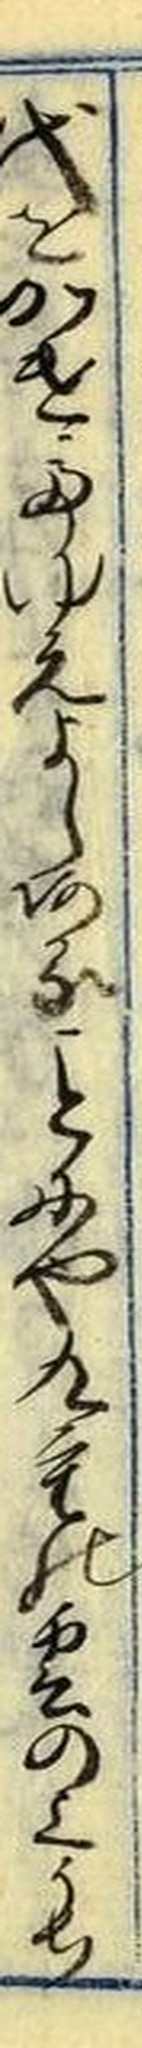代をかけてゆえよしあることにや九重の雲の上うち
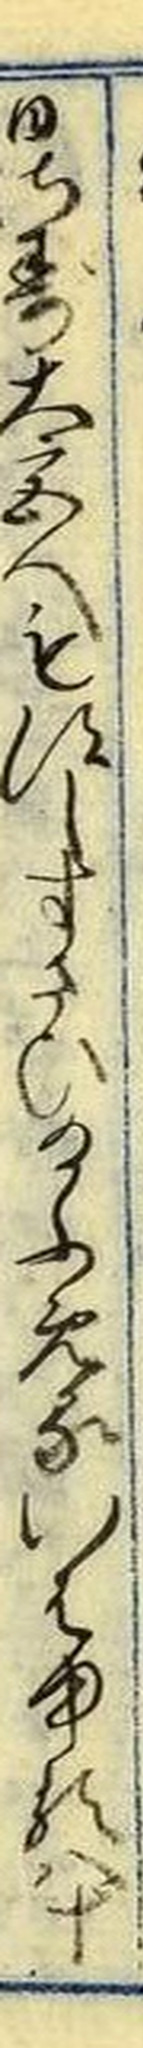日さす大宮人も得しすさひ給ふめるいはゆる八十
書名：温古集 三巻
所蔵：福井県文書館 Fukui Prefectural Archives
